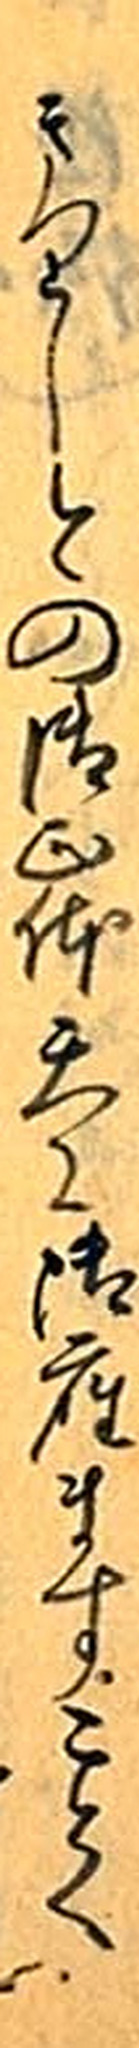きりしとの御正体天に御座ますことく
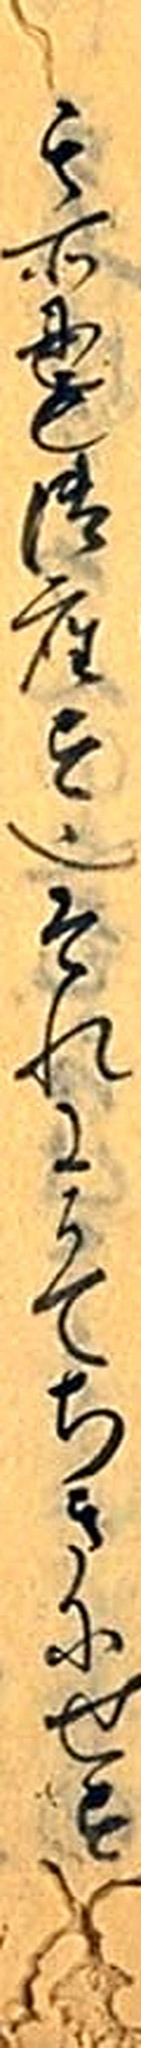其所にも御座す也それによてちきにせす
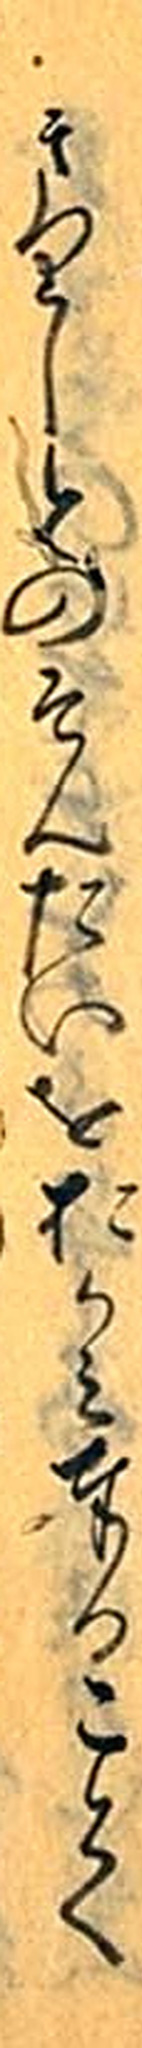きりしとのそんたいをおかみ奉ることく
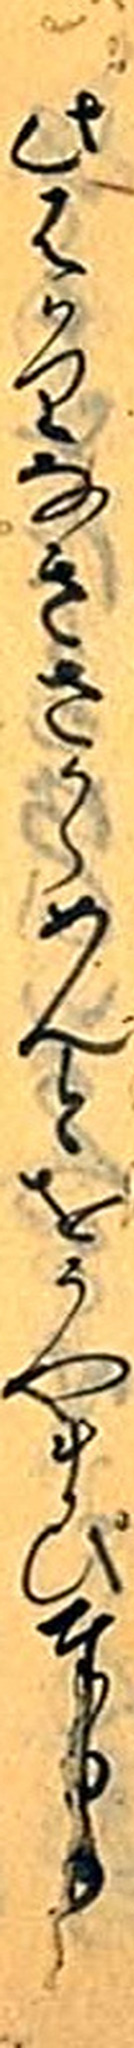此はかりなきさからめんとをうやまひ奉る事
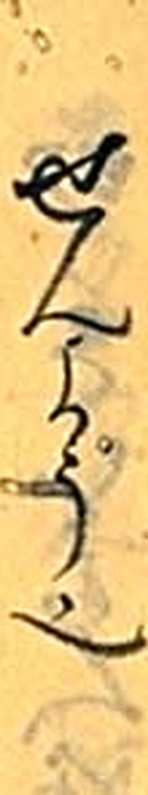せんよう也
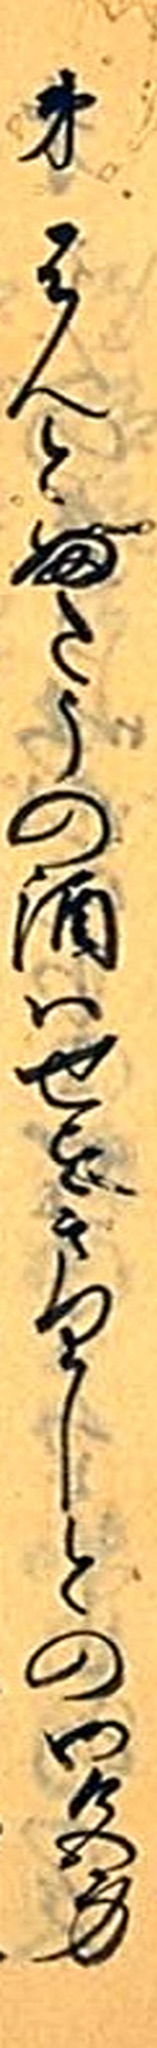弟はんとふたうの酒はせすきりしとの御色身
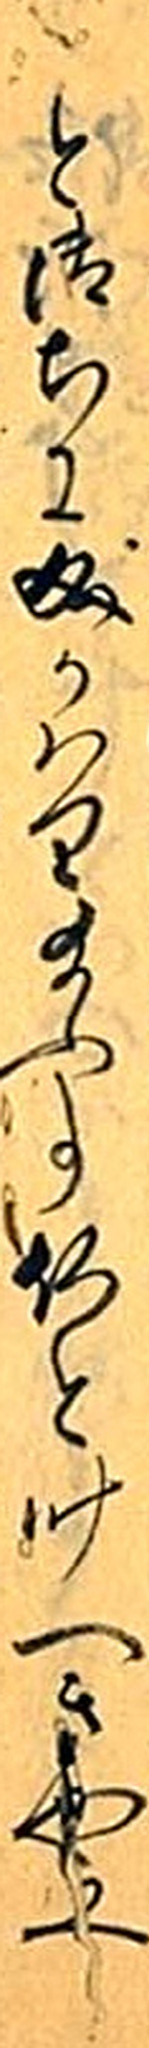と御ちに成かはり給ふ事何と叶へきや又
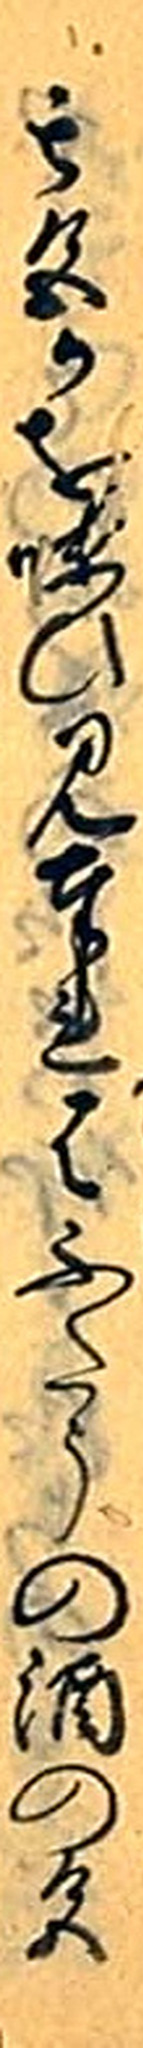其色かを味ひ見奉れはふたうの酒の色
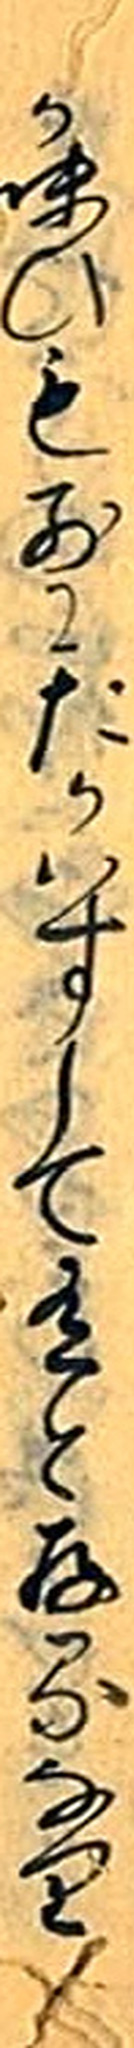か味ひも前にたかはすして有と存るなり
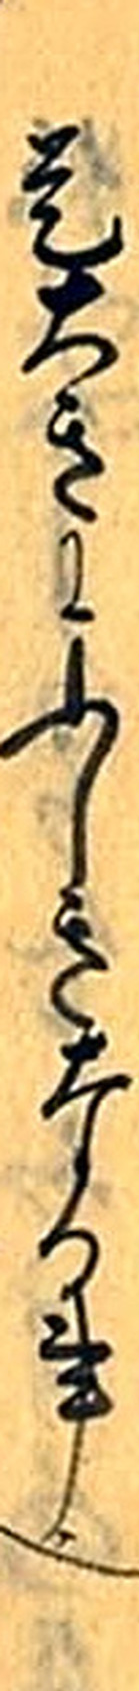是大きにふしきなる事也
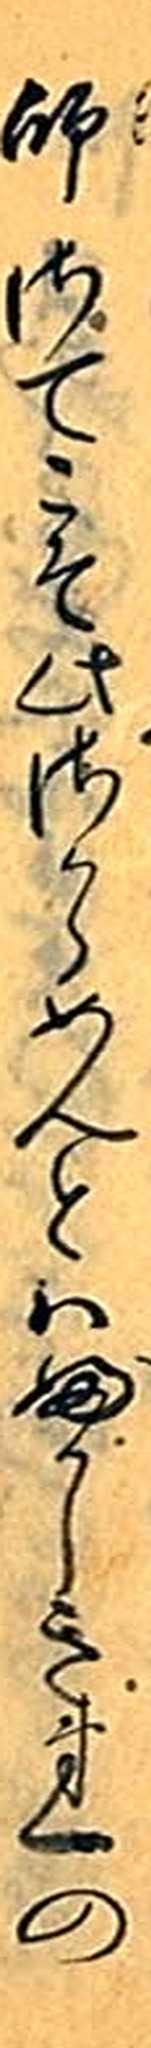師さてこそ此さからめんとはふかしき第一の
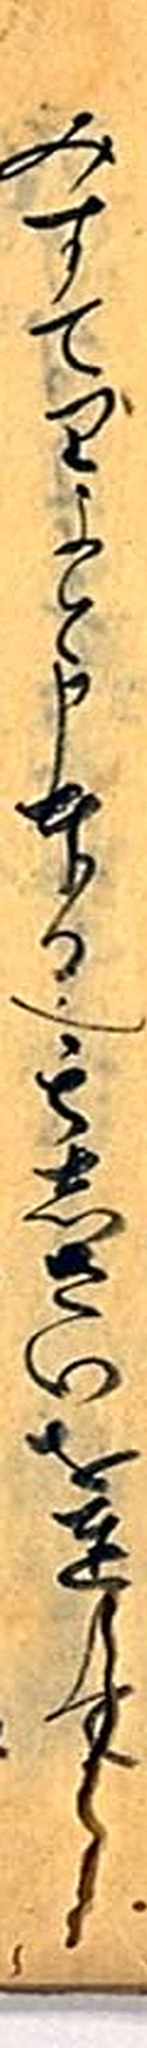みすてりよと申奉る也其しさいを達して
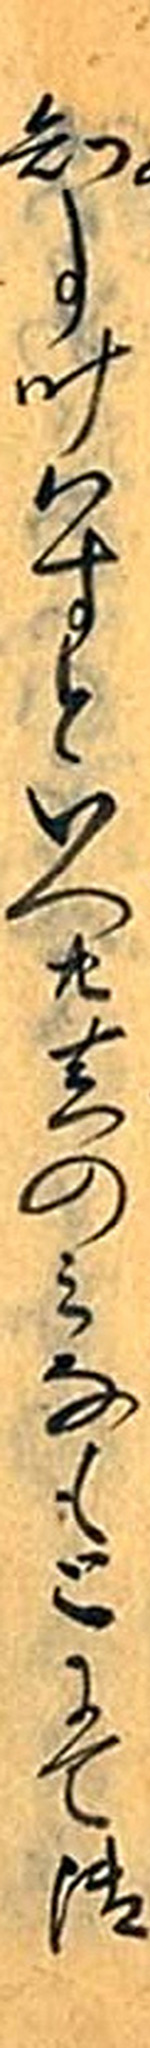知事叶はすといへ共真のみまもとにて御
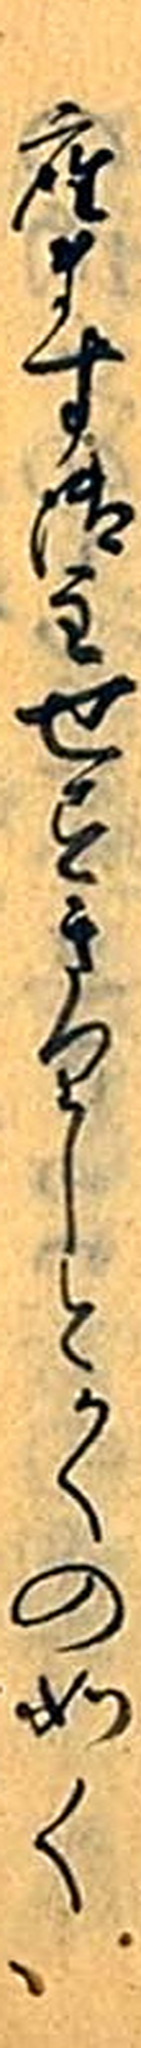座ます御主せすきりしとかくの如く
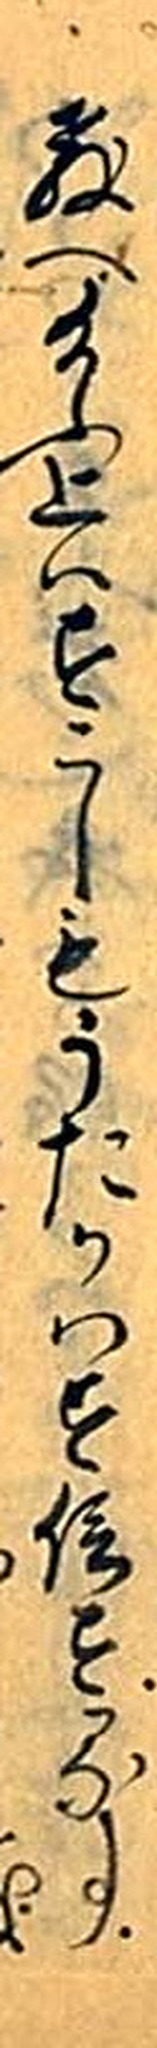教へ給ふ上はすこしもうたかはす信する事
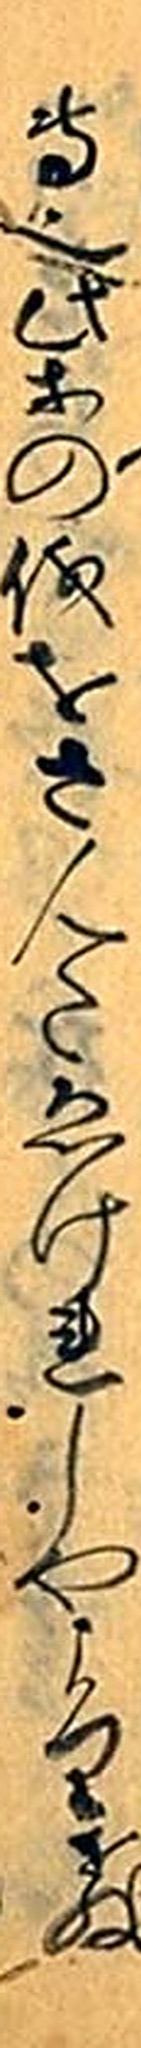専也此等の儀をさんたゑけれしやより教
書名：ドチリナ・キリシタン
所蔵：東京大学総合図書館 / General Library in the University of Tokyo
